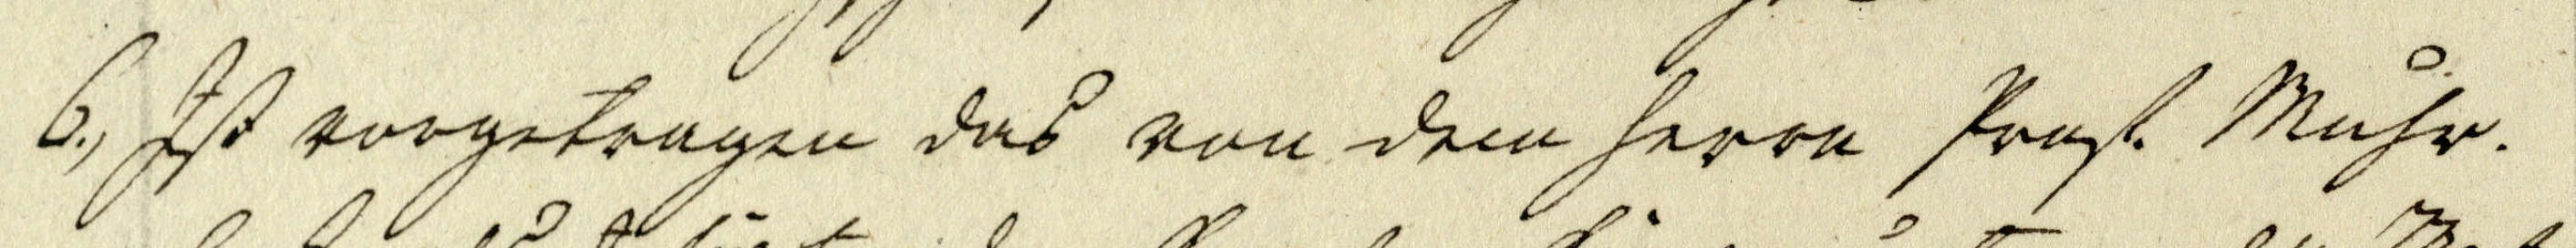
6., Ist vorgetragen das von dem Herrn Prof. Muhr¬
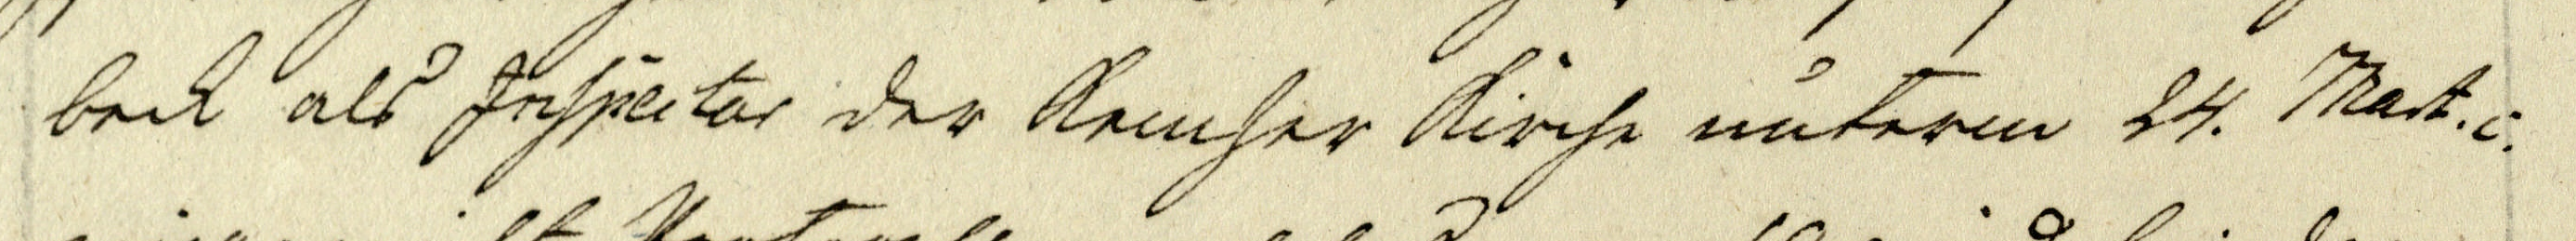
beck als Inspector der Kemzer Kirche unterm 24. Mart. c.
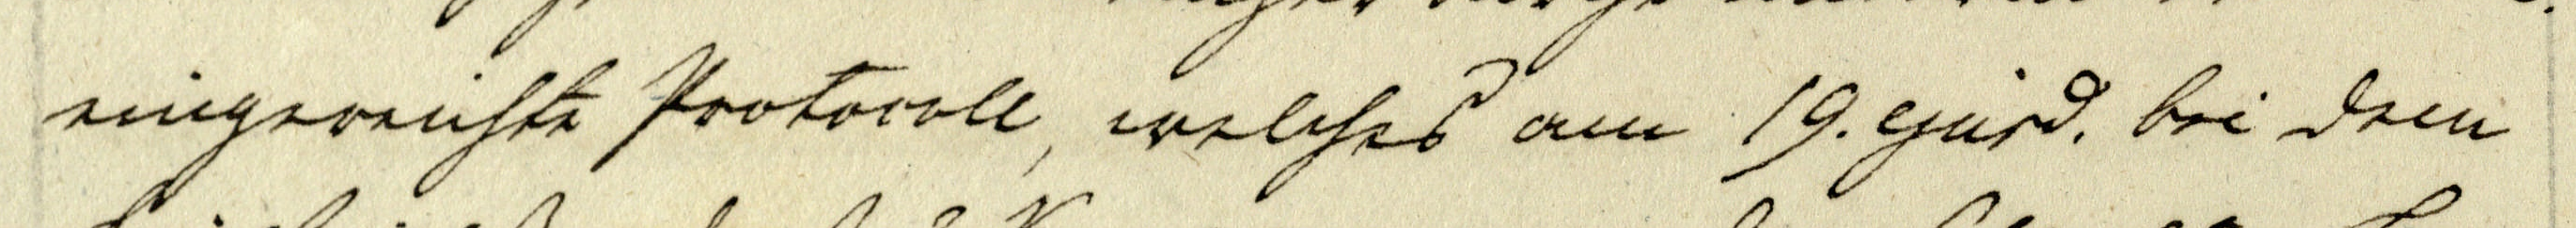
eingereichte Protocoll, welches am 19. ejusd. bei dem
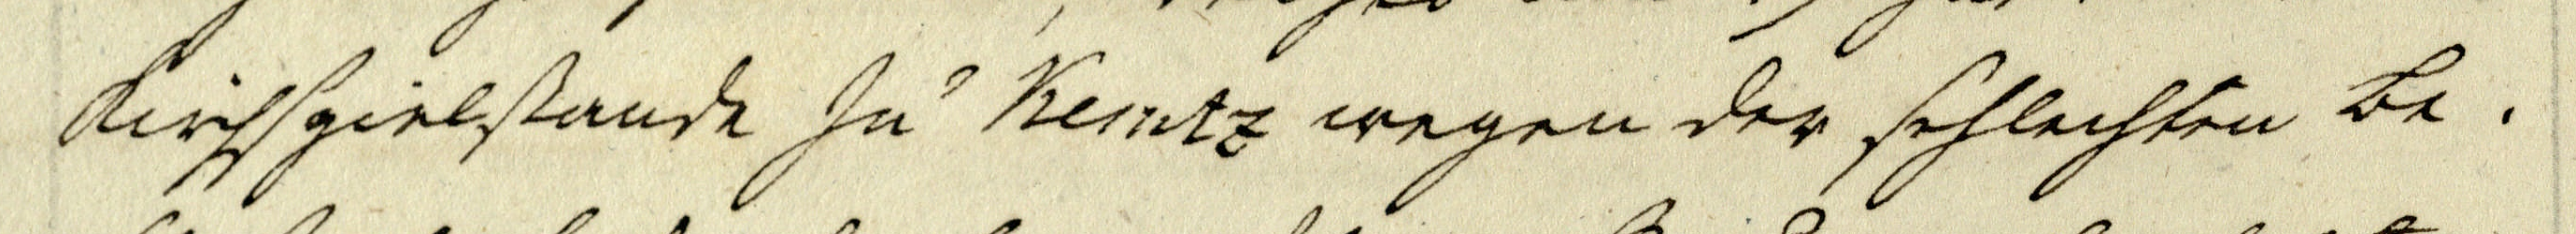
Kirchspielstande zu Kemtz wegen der schlechten Be¬
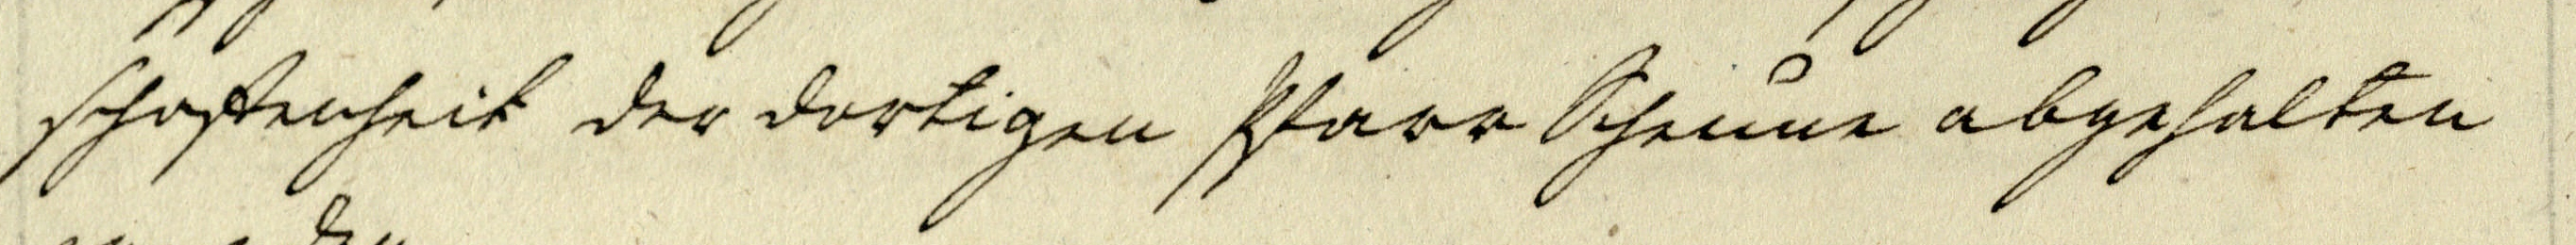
schaffenheit der dortigen Pfarr Scheune abgehalten
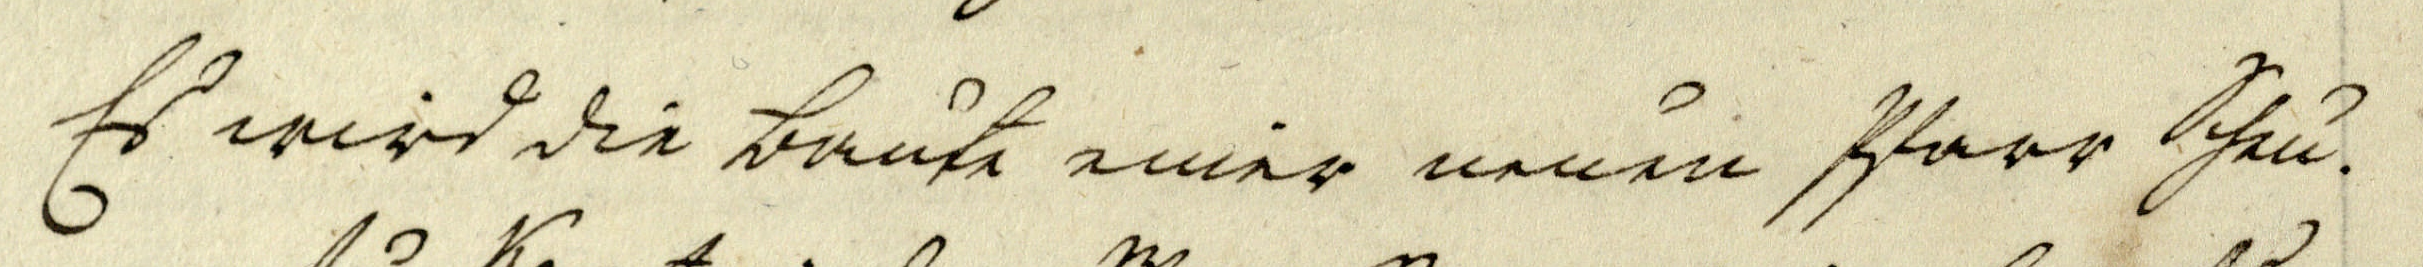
Es wird die Baute einer neuen Pfarr Scheu¬
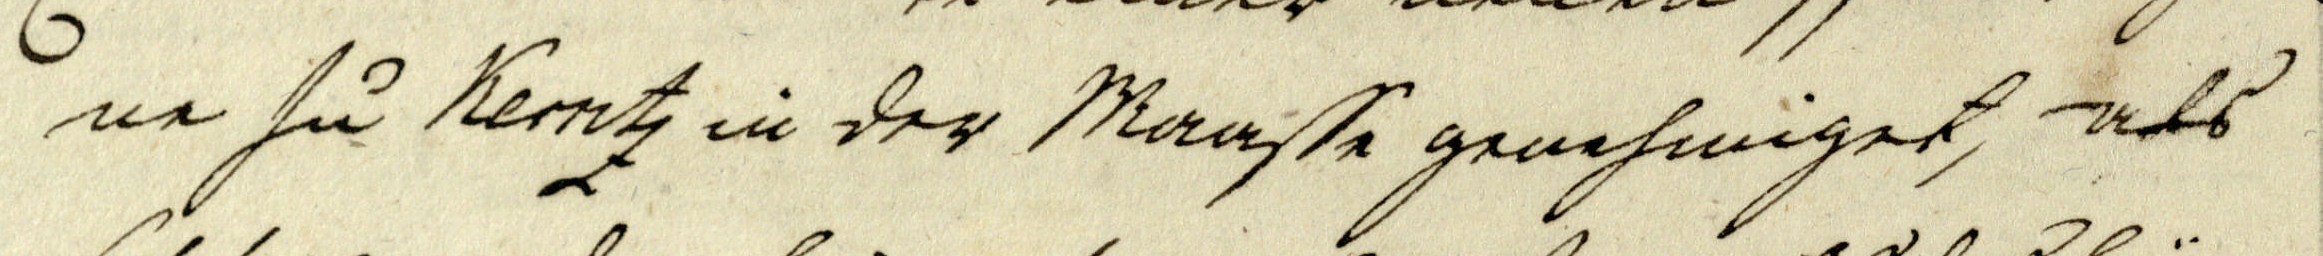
ne zu Kemtz in der Maasse genehmiget, als
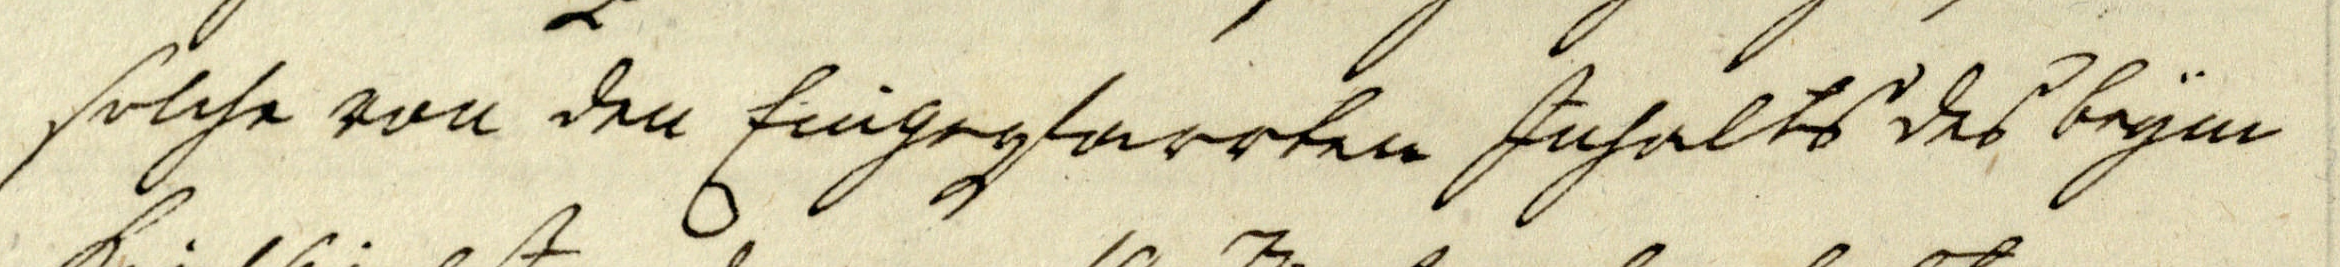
solche von den Eingepfarrten Inhalts des beÿm
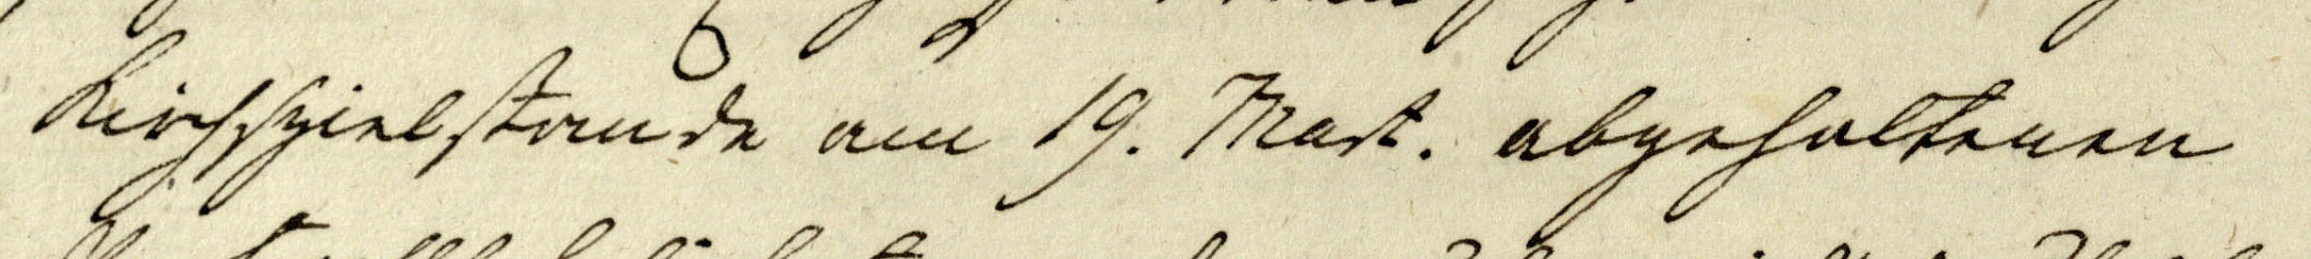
Kirchspielstande am 19. Mart. abgehaltenen
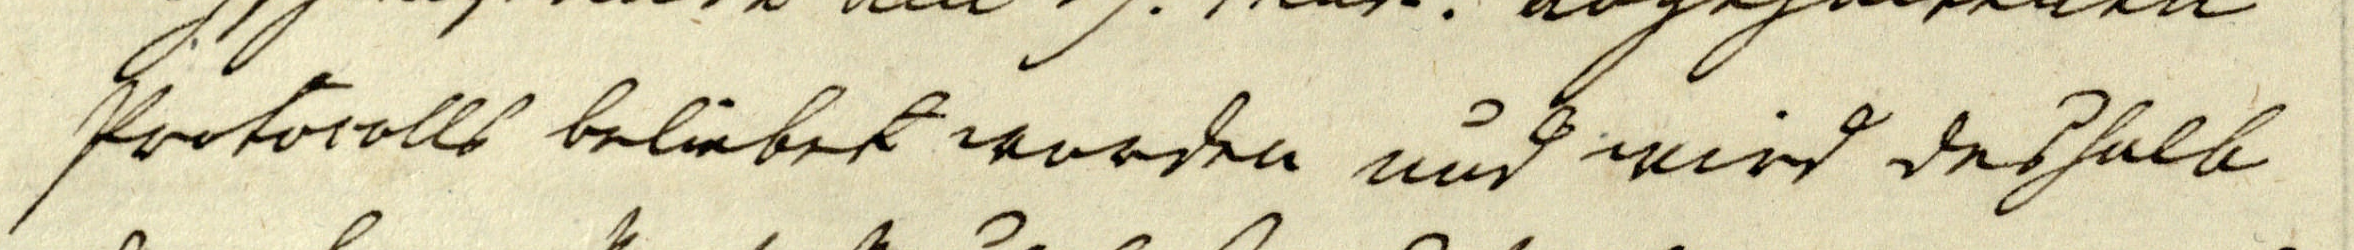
Protocolls beliebet worden und wird deshalb
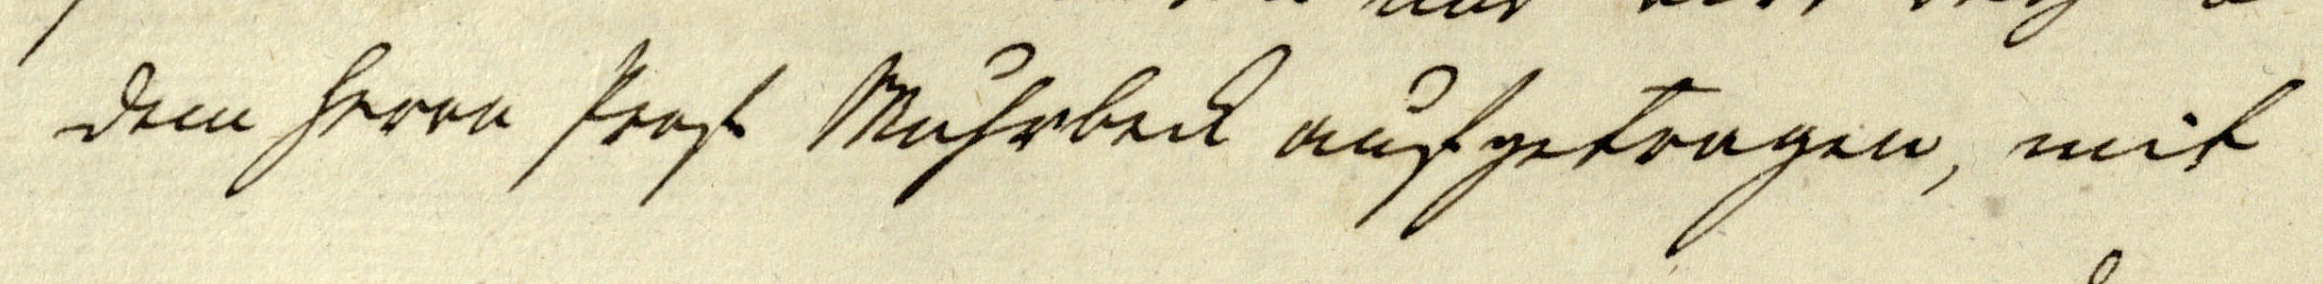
dem Herrn Prof. Muhrbeck aufgetragen, mit
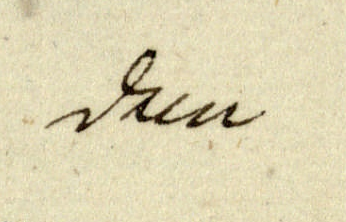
dem
